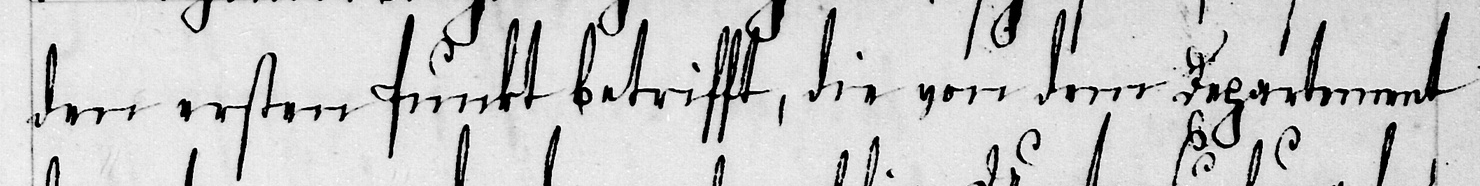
den ersten Punkt betrifft, die von dem Departement
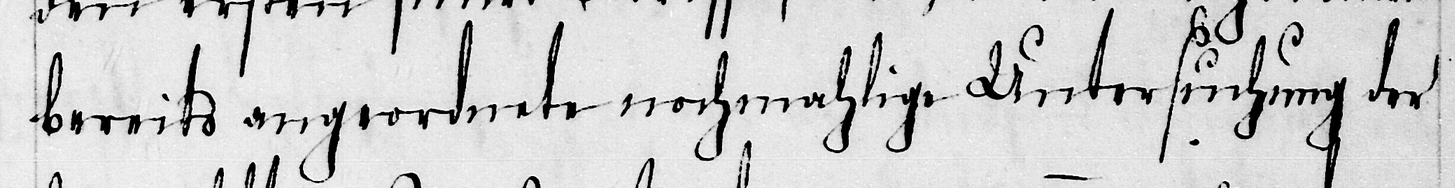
bereits angeordnete nochmahlige Untersuchung der
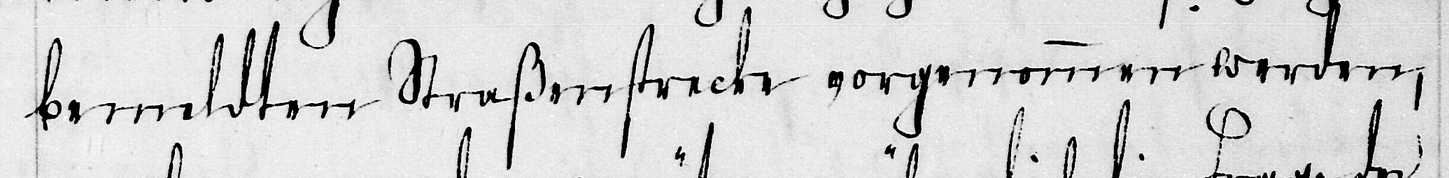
bemeldten Straßenstrecke vorgenommen werden,
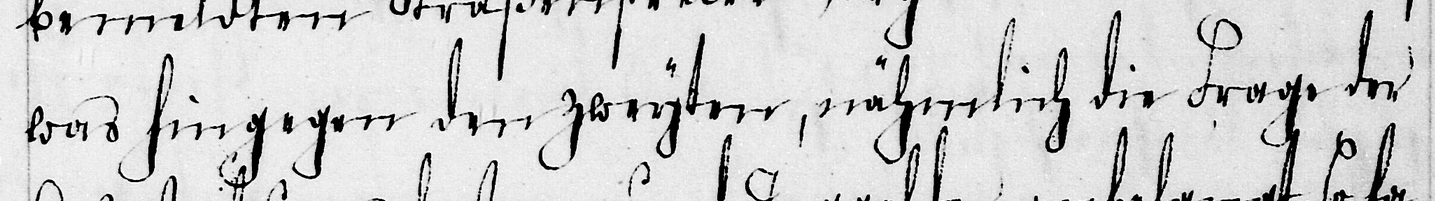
was hingegen den zweyten, nähmlich die Frage der
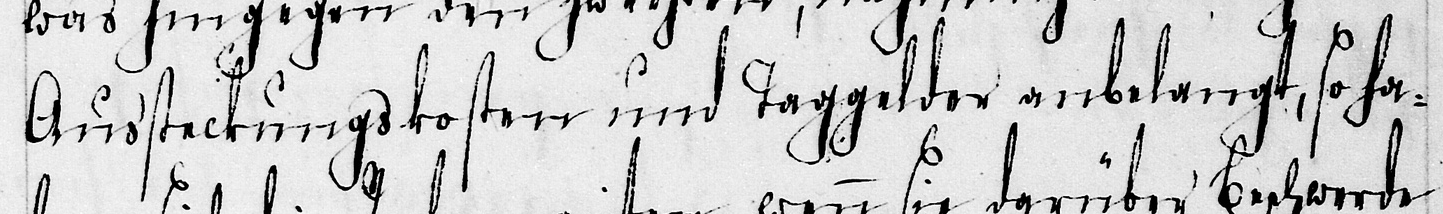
Ausstreckungskosten und Taggelder anbelangt, so ha¬
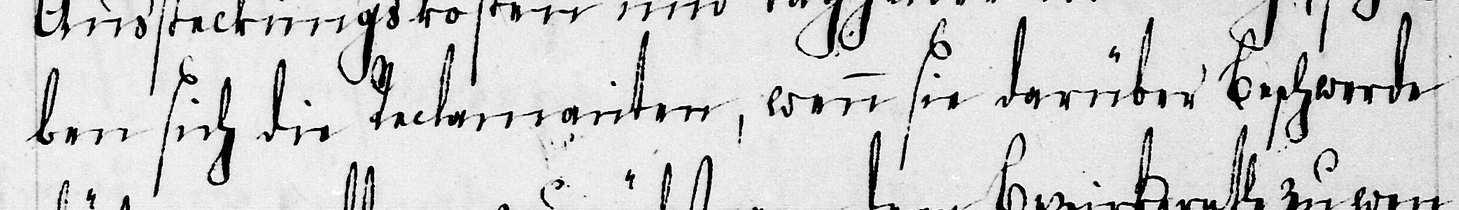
ben sich die Reclamanten, wenn sie darüber Beschwerde
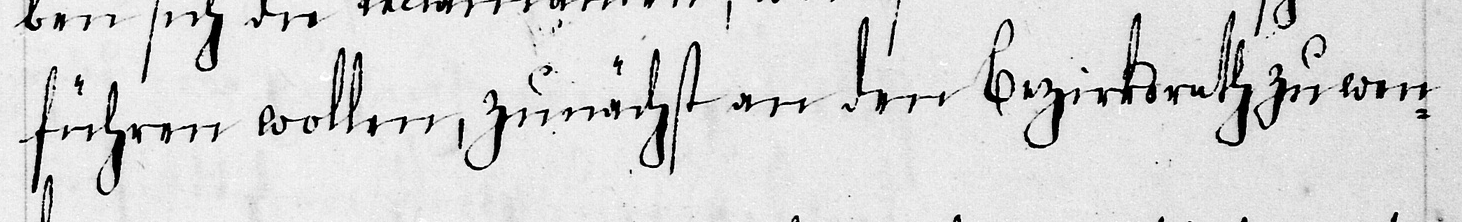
führen wollen, zunächst an den Bezirksrath zu wen¬
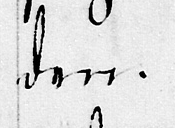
den.
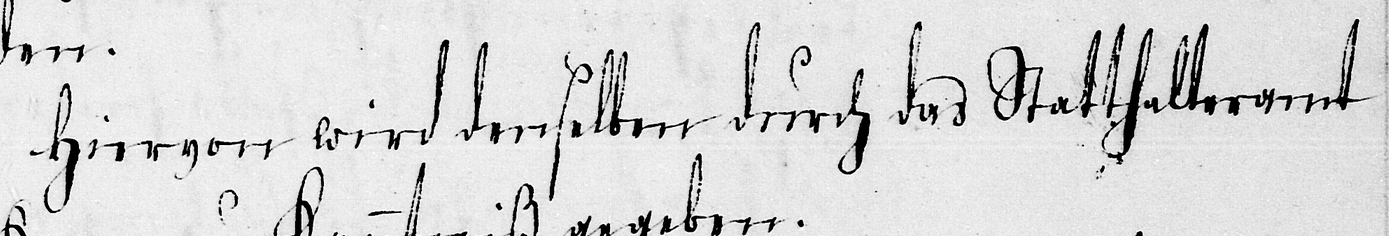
Hiervon wird denselben durch das Statthalteramt
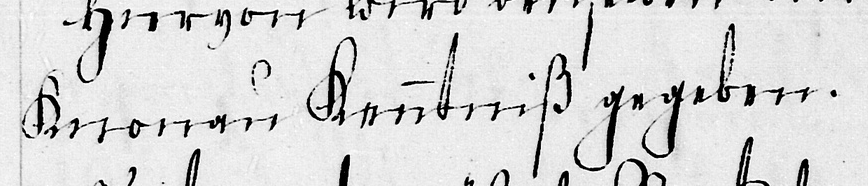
Knonau Kenntniß gegeben.
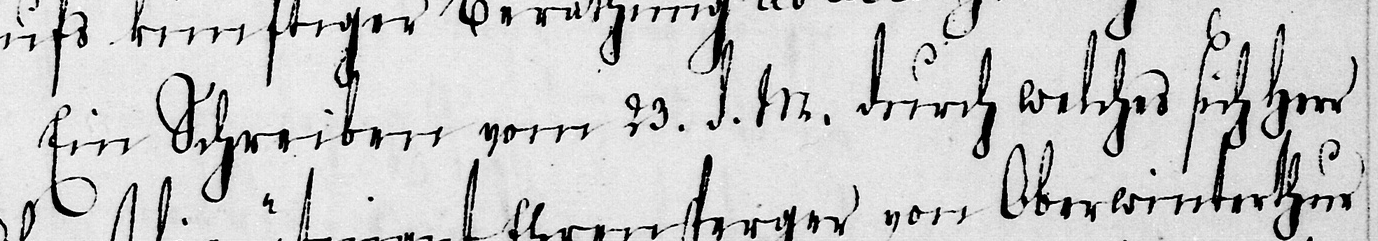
Ein Schreiben vom 23. d. M. durch welches sich Her¬
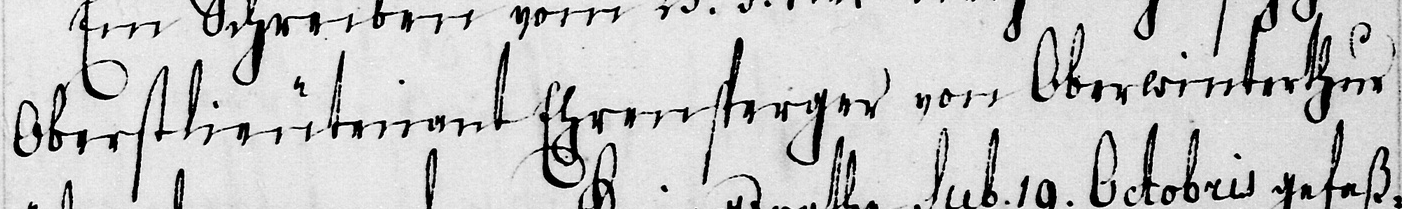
Oberstlieutenant Ehrensperger von Oberwinterthur
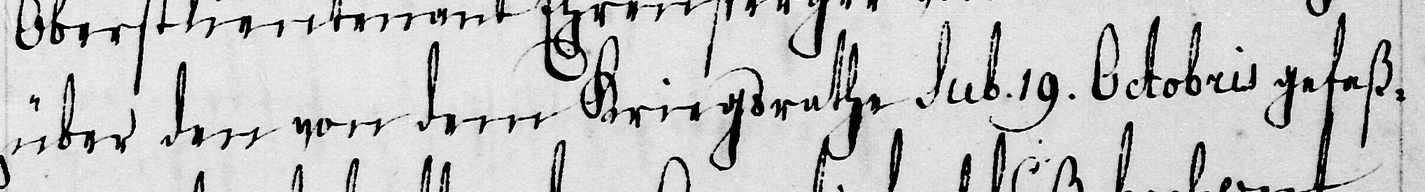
über den von dem Kriegsrathe Sub. 19. Octobris gefaß¬
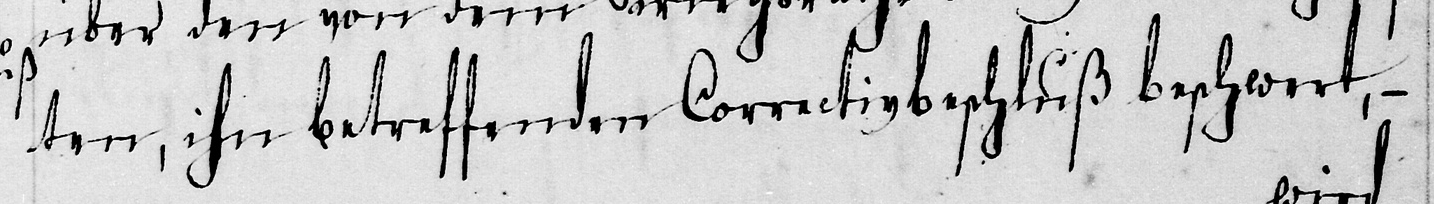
ten, ihn betreffenden Correctivbeschluß beschwert, –
